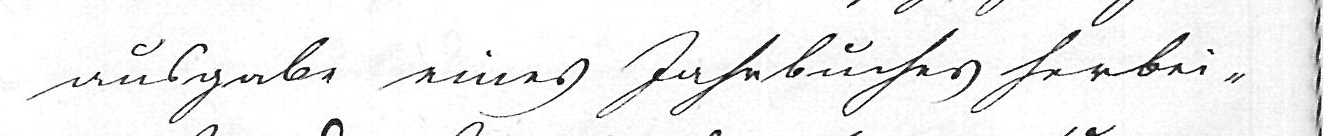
ausgabe eines Jahrbuches hierbei-
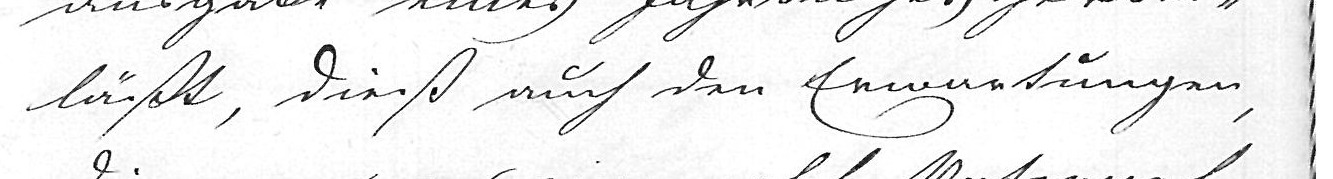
läßt, dieß auch den Erwartungen,
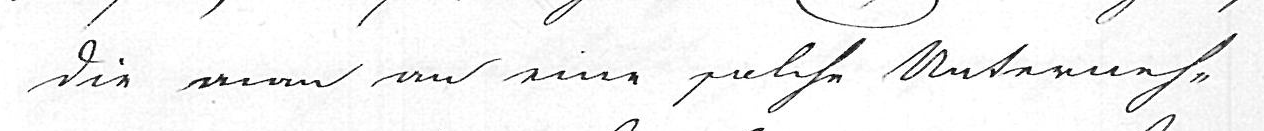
die man an eine solche Unterneh-
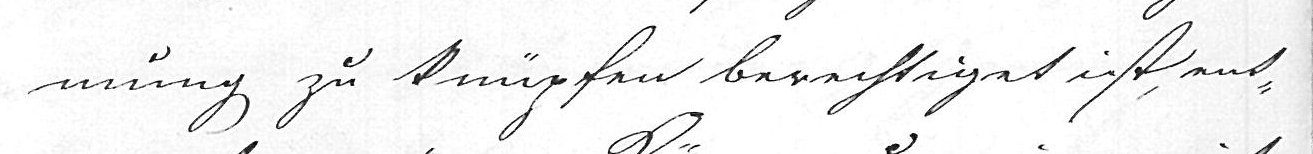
mung zu knüpfen berechtiget ist, ent-
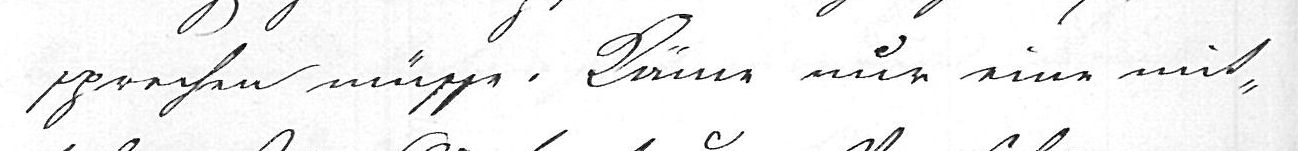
sprechen müsse. Käme nur eine mit-
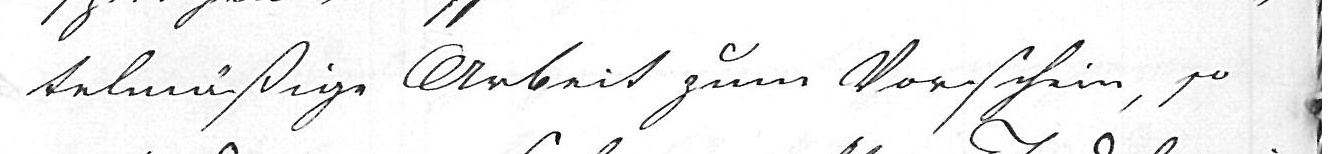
telmäßige Arbeit zum Vorschein, so
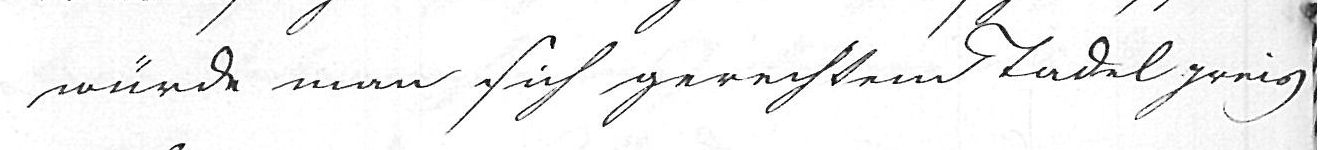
wurde man sich gerechtem Tadel preis
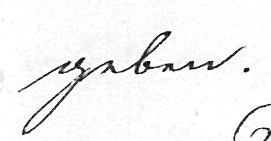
geben.
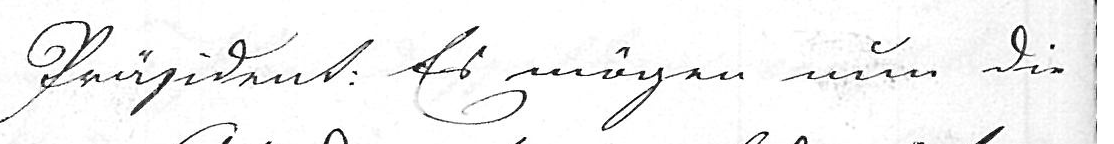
Präsident: Es mögen nun die
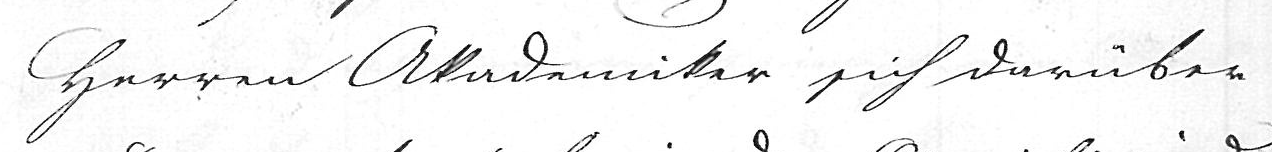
Herren Akademiker sich darüber
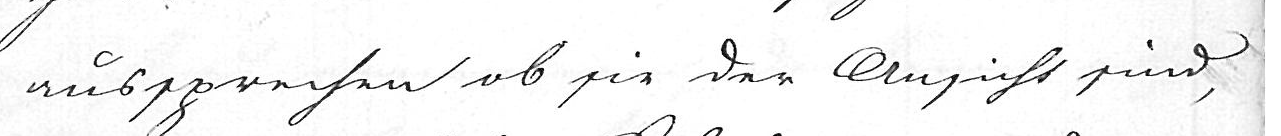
aussprechen ob sie der Ansicht sind,
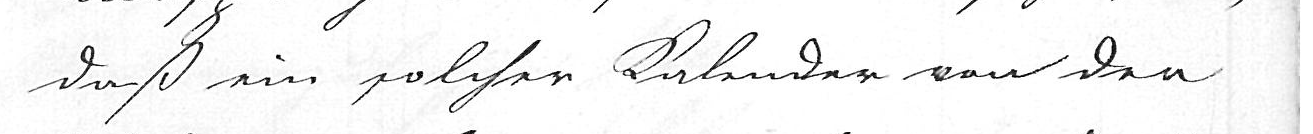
daß ein solcher Kalender von der
